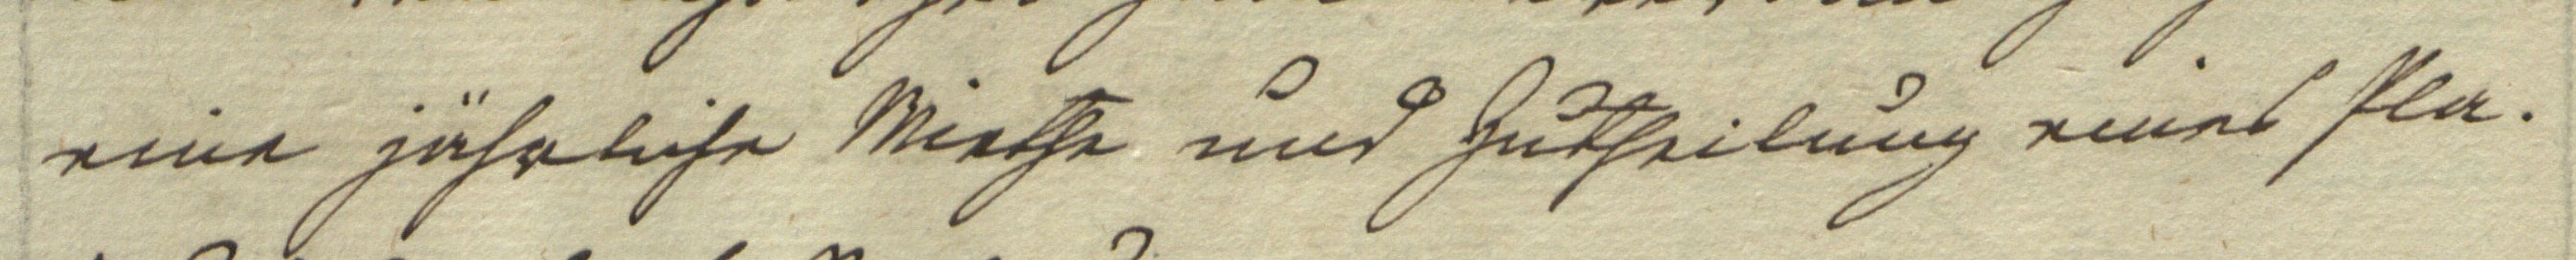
eine jährliche Miethe und Zutheilung eines Pla¬
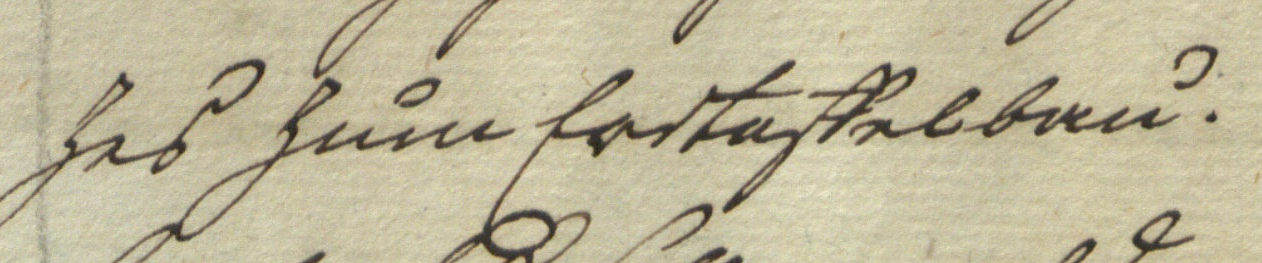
zes zum Erdtoffelbau.
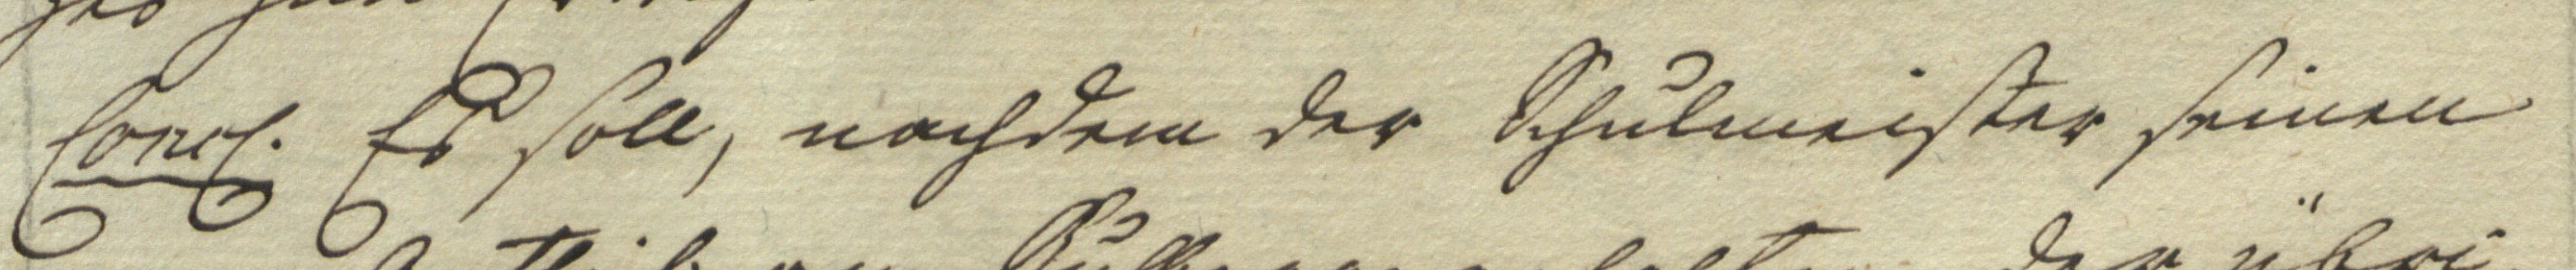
Concl. Es soll, nachdem der Schulmeister seinen
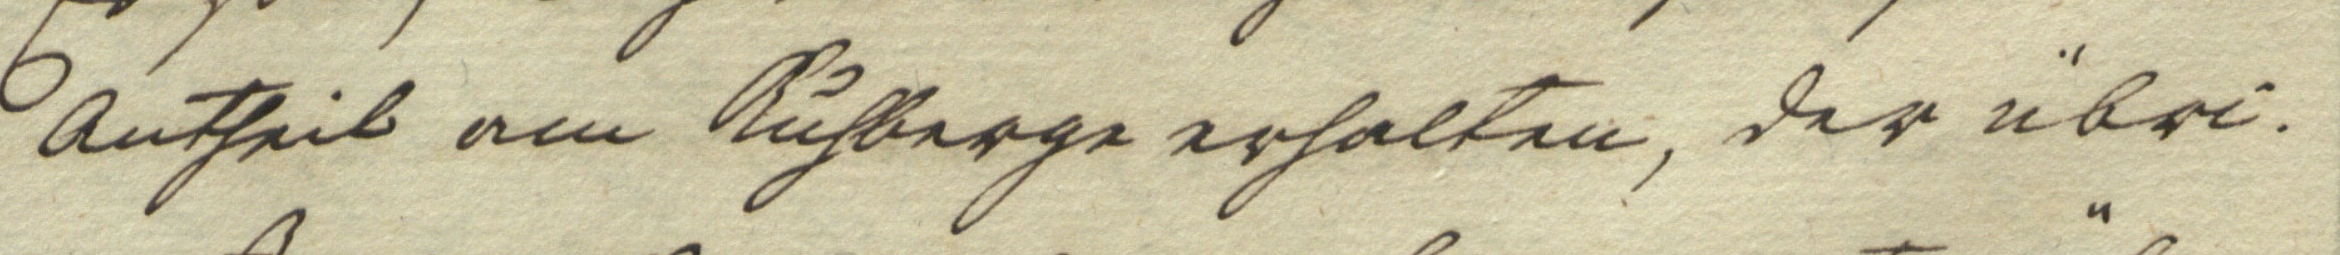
Antheil am Kuhberge erhalten, der übri¬
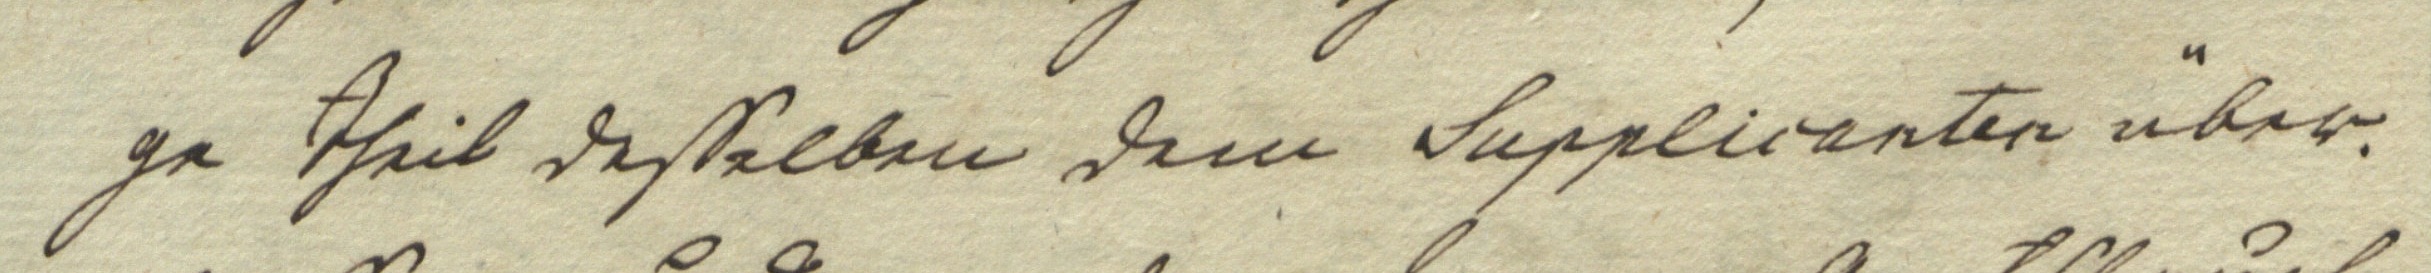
ge Theil desselben dem Supplicanten über¬
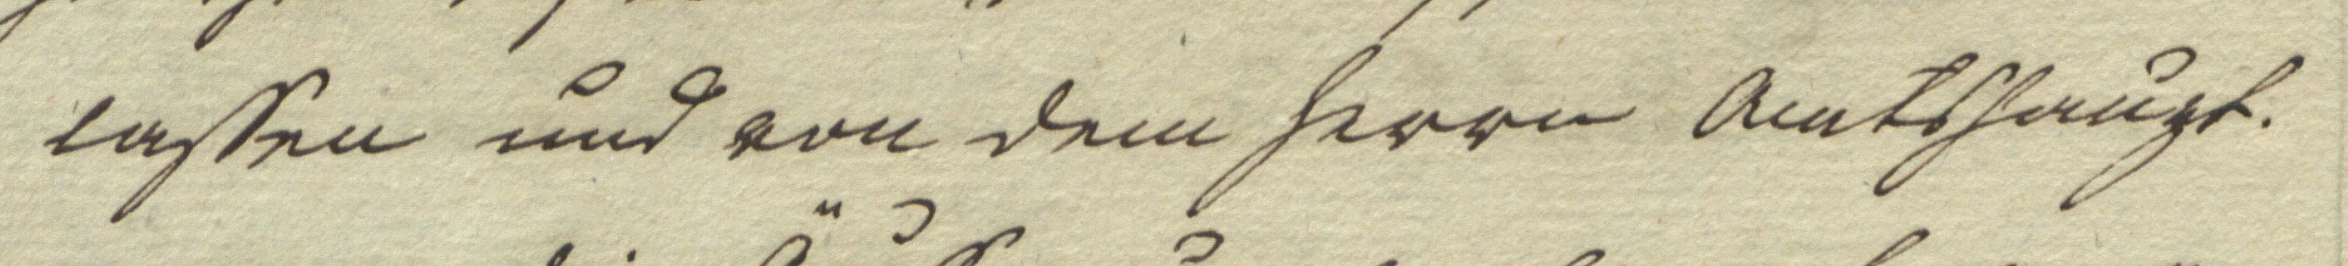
lassen und von dem Herrn Amtshaupt¬
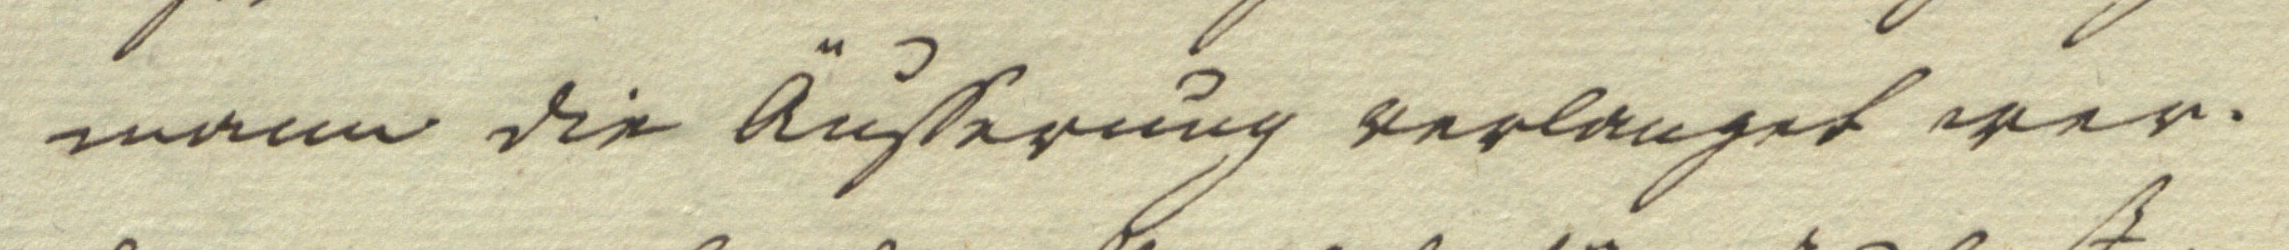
mann die Äusserung verlanget wer¬
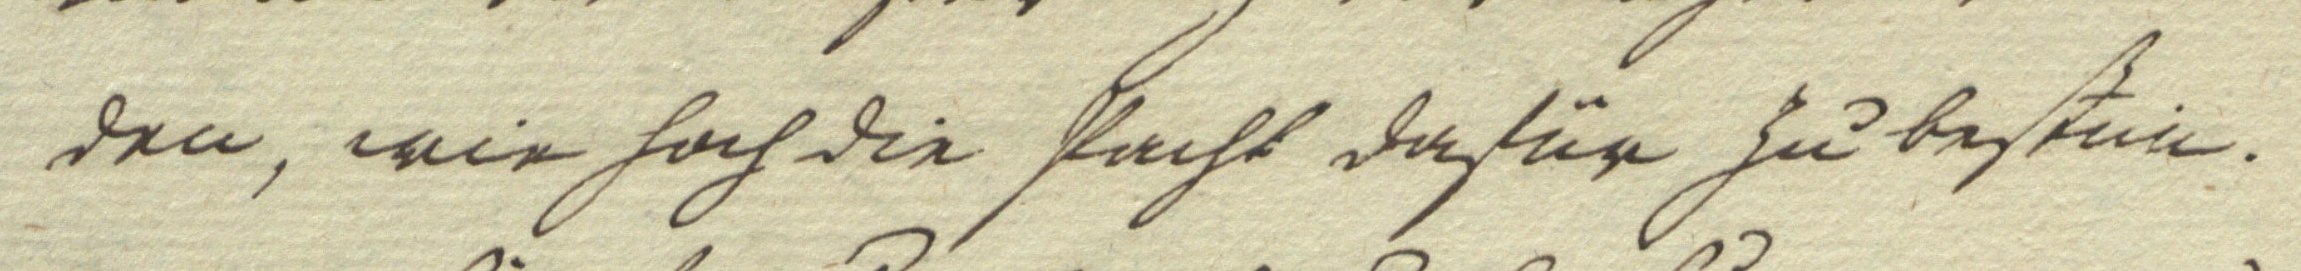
den, wie hoch die Pacht dafür zu bestim¬
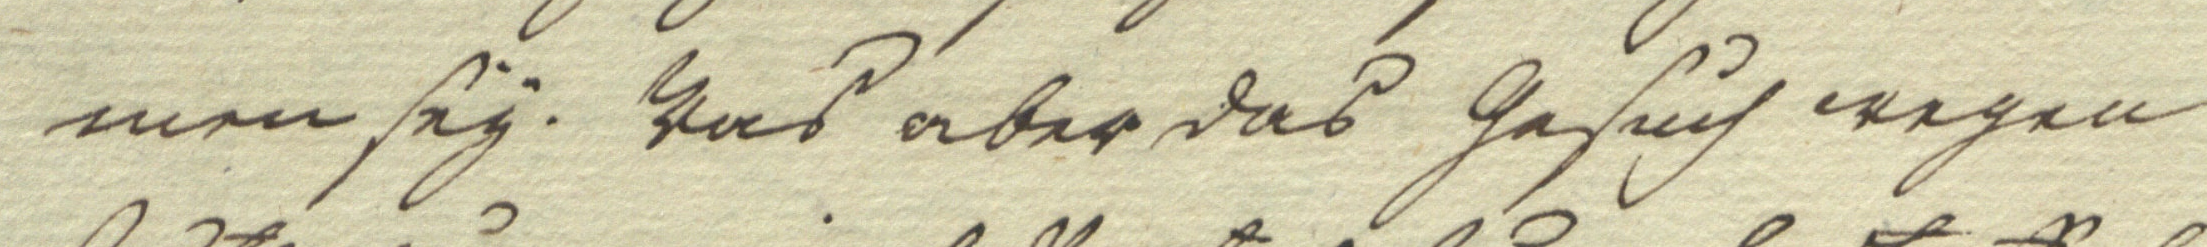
men seÿ. Was aber das Gesuch wegen
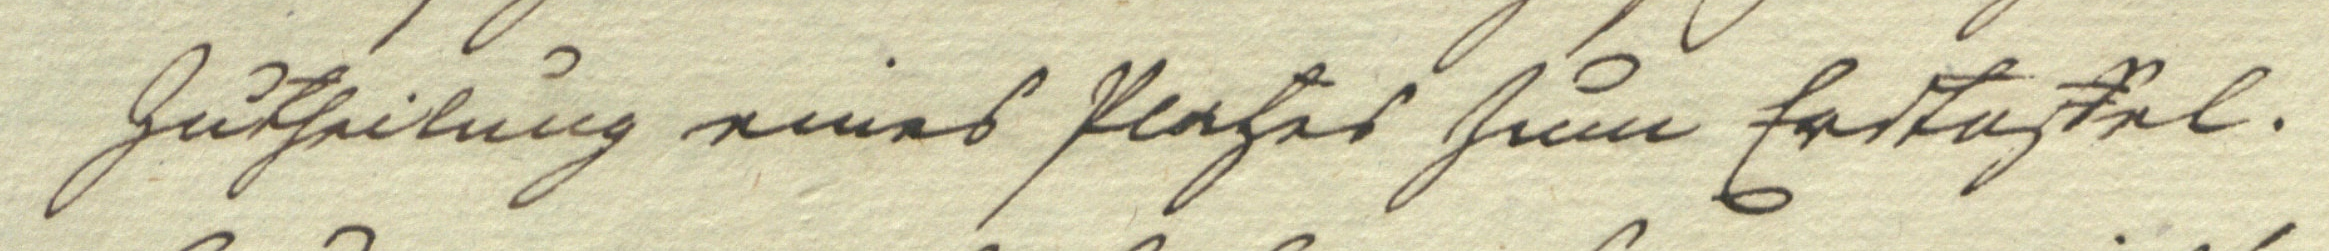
Zutheilung eines Platzes zum Erdtoffel¬
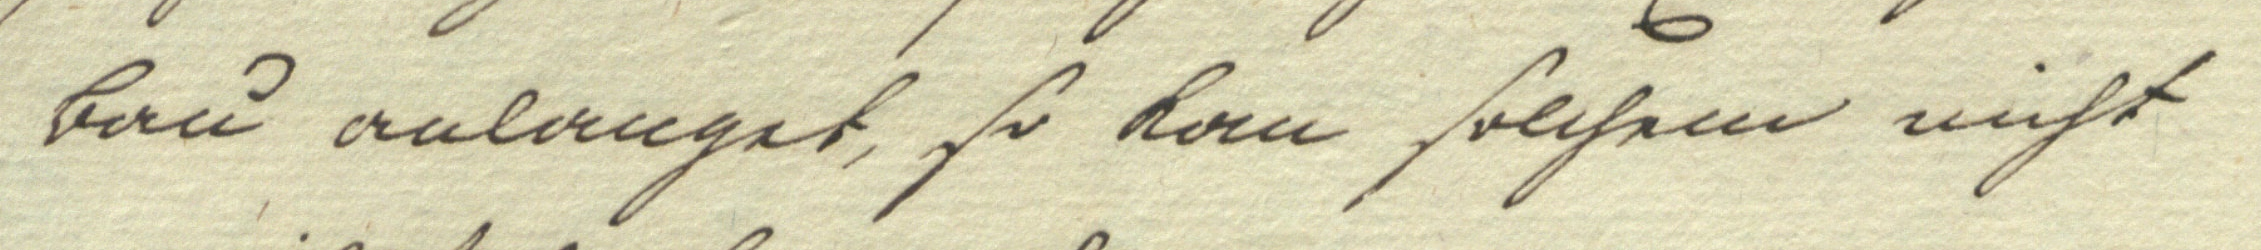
Bau anlanget, so kan solchem nicht
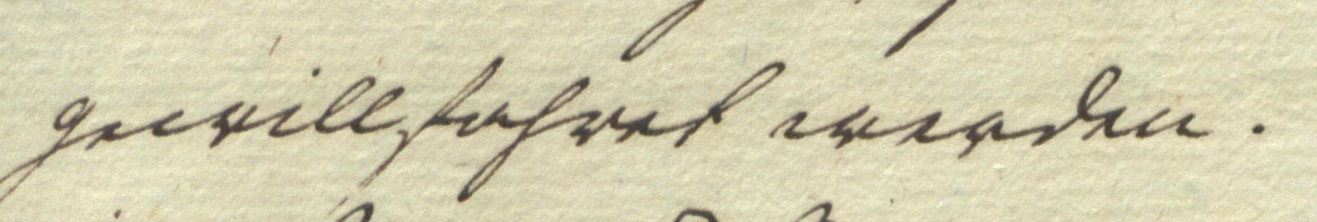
gewillfahret werden.
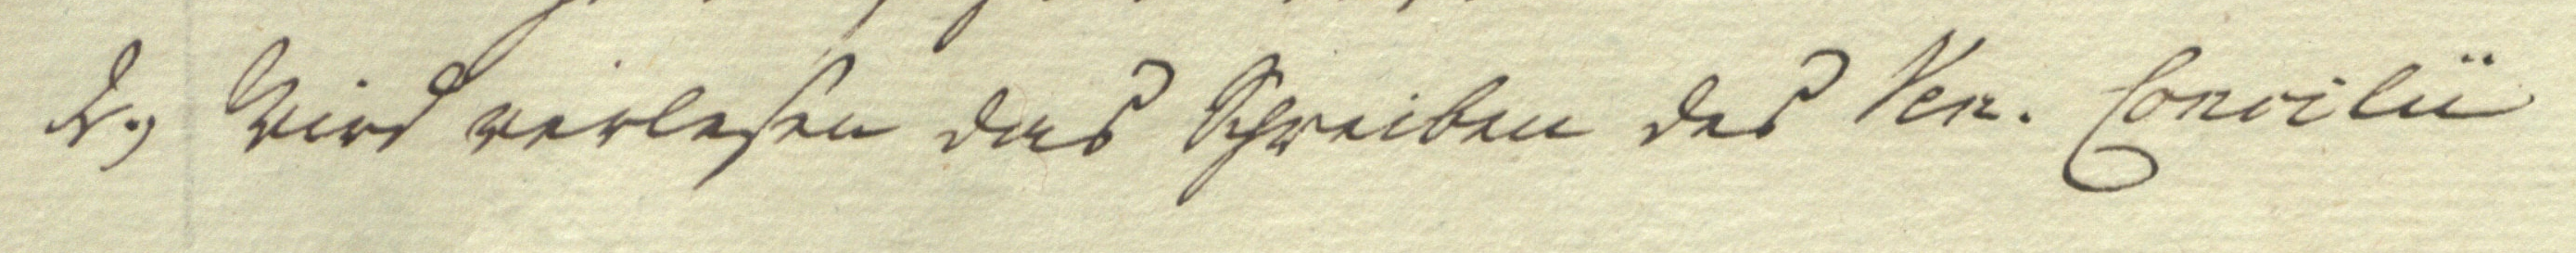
2., Wird verlesen das Schreiben des Ven. Concilii
